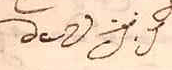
de V J.S
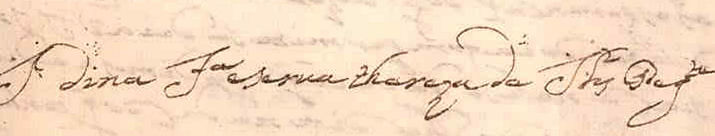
Jdina fa e serua thereza de Jhs̄ Regte
